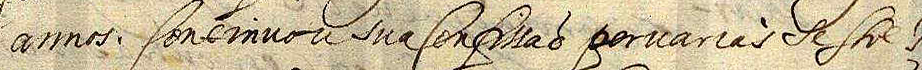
annos. Continuou sua Confissaõ per uarias sessões
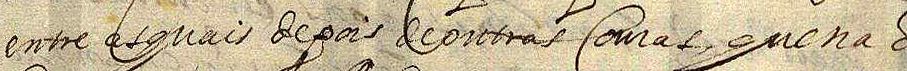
entre as quais depois de outras Couzas, que naõ
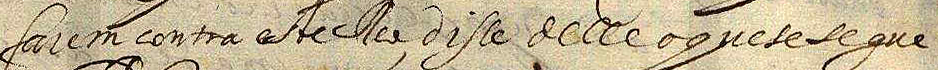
fazem contra este Reo, disse delle o que se segue.
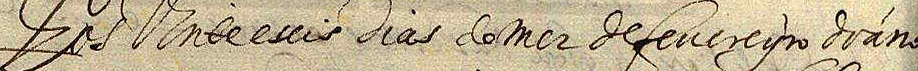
Aos Vinte e seis dias do mez de feuereyro do ano
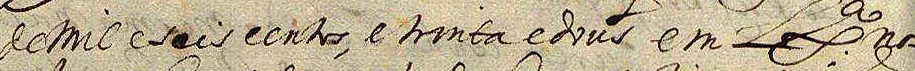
de mil e seiscentos, e trinta e dous em Lx.a nos
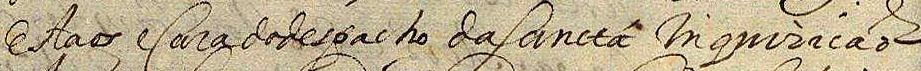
Estaos, e Caza do despacho da Sancta Inquiziçaõ
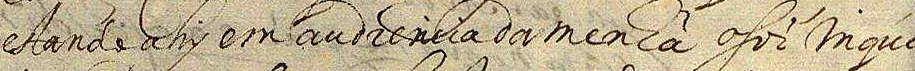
estando ahy em audiencia da menhā o sor̄ Inqui
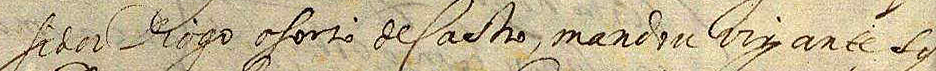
sidor Diogo osorio de Castro, mandou vir ante sy
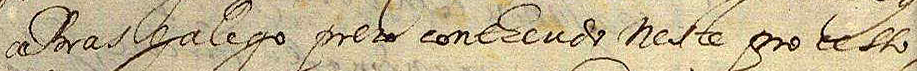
a Bras Galego prezo contheudo neste processo,
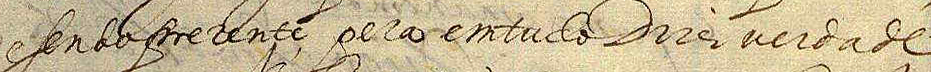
e sendo prezente, pera em tudo Dizer uerdade
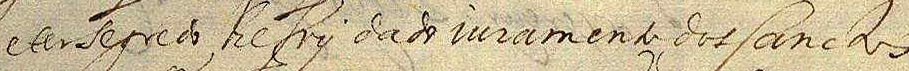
e ter segredo, lhe foy dado iuramento dos Sanctos
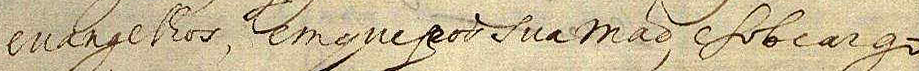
euangelhos, em que pos sua maõ, e sob cargo
